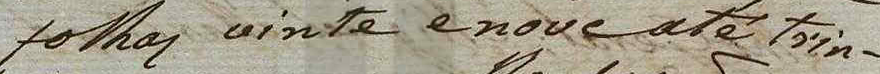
folhas vinte e nove até trin
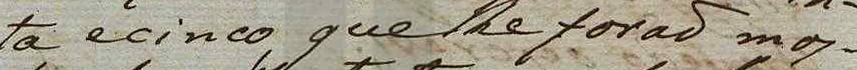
ta e cinco, que lhe foraõ mos
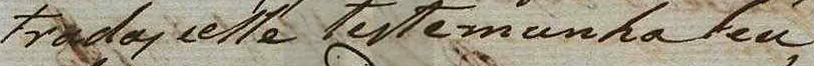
tradas e elle testemunha leu
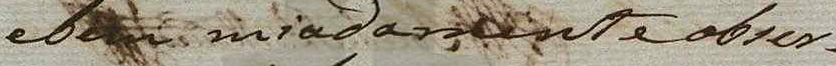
e bem miudamente obser
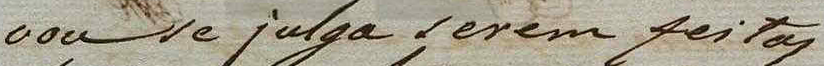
vou se julga serem feitas
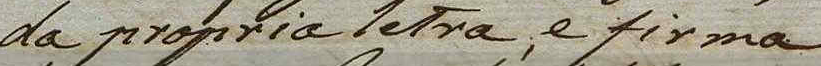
da propria letra, e firma
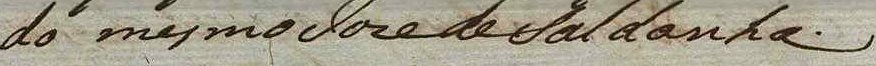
do mesmo Ioze de Saldanha.
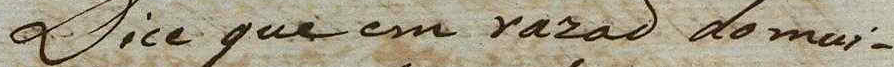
Dice que em razaõ do mui
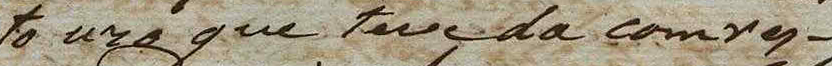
to uzo que teve da comres
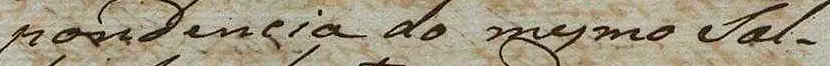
pondencia do mesmo Sal
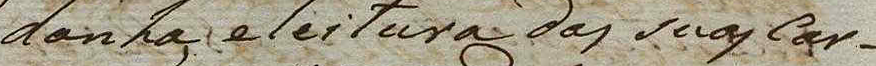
danha, e leitura das suas car
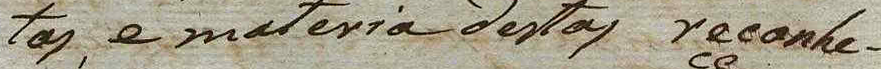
tas, e materia destas reconhe
